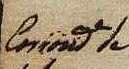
Coriozid.e de
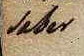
saber
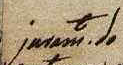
juram.to do
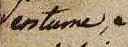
costume, e
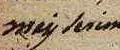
mais serimo
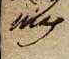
nias
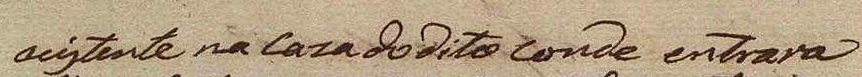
acistente na caza do dito conde entrava
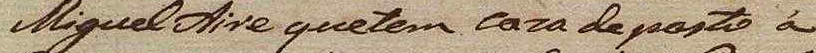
Miguel Aire que tem caza de posto á
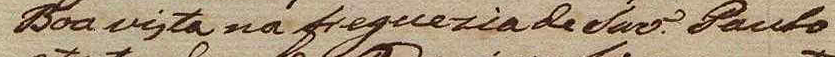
Boa vista na freguezia de Saõ Paulo
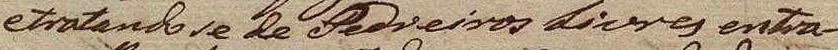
e tratandose de Pedreiros Livres entra
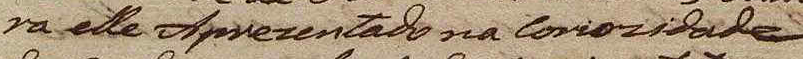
ra elle Aprezentado na coriozidade
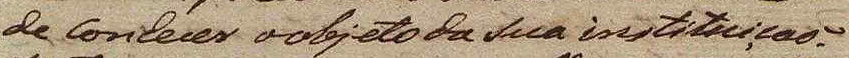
de conhecer o objecto da sua instituiçaõ
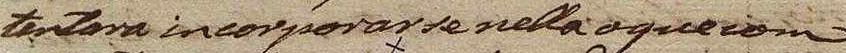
tentara incorporar se nella o que com
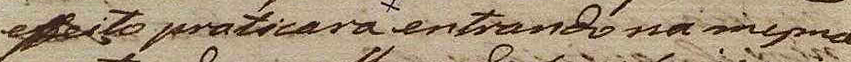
effeito praticara entrando na mesma
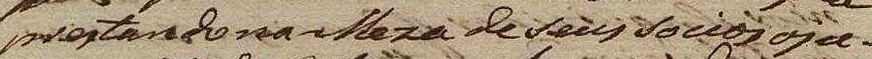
prestando na Meza de seus socios o ju
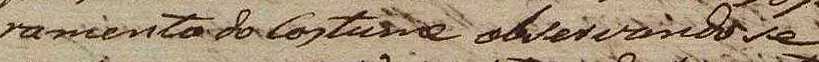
ramento do Costume observando se
